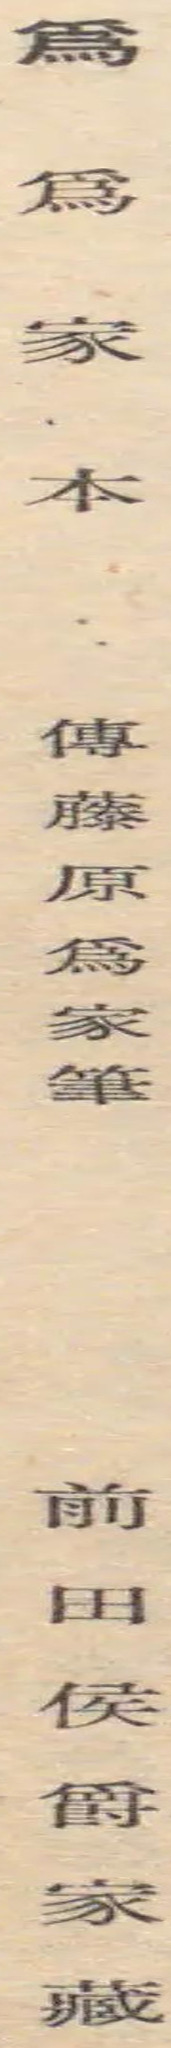為為家本伝藤原為家筆前田侯爵家蔵
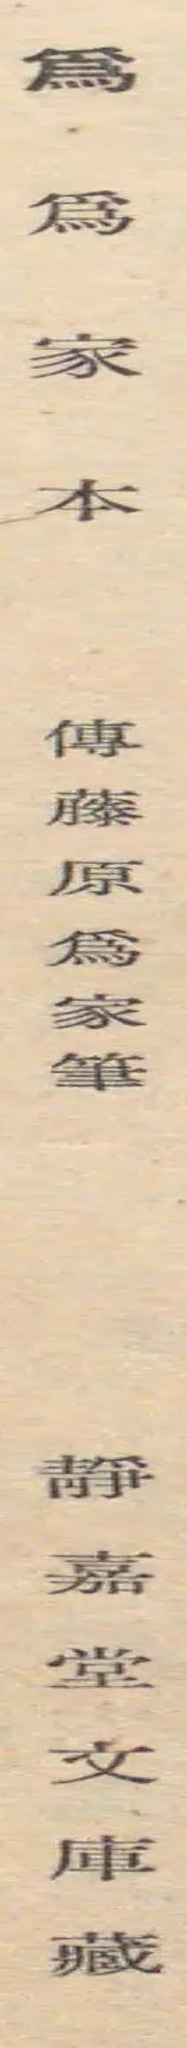為為家本伝藤原為家筆静嘉堂文庫蔵
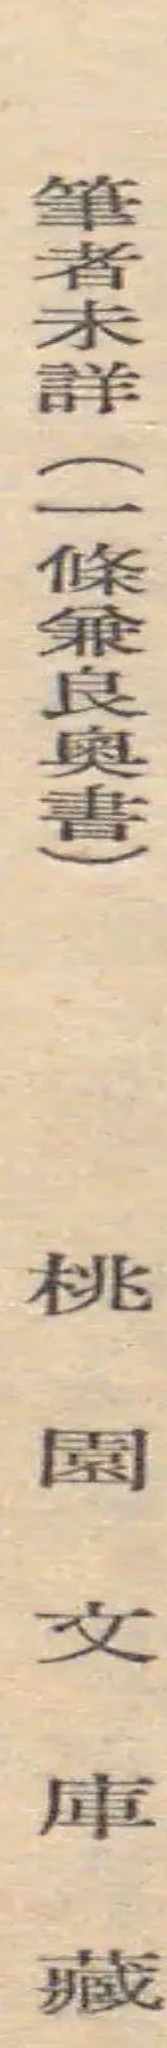兼筆者未詳(一条兼良奥書)桃園文庫蔵
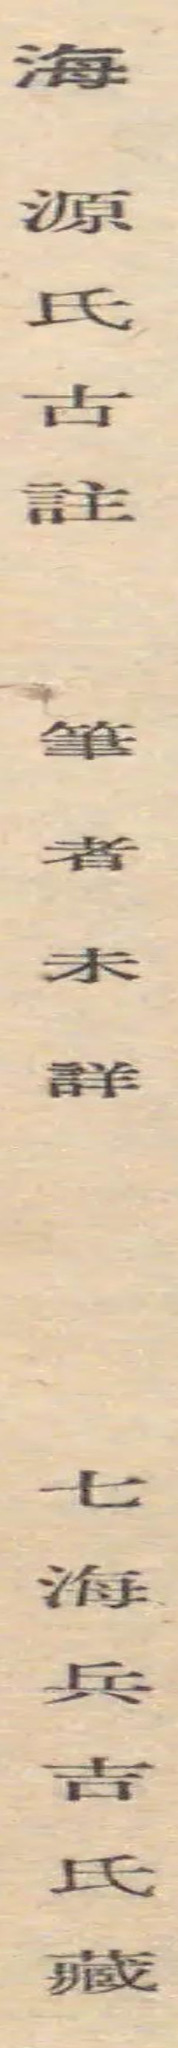海源氏古註筆者未詳七海兵吉氏蔵
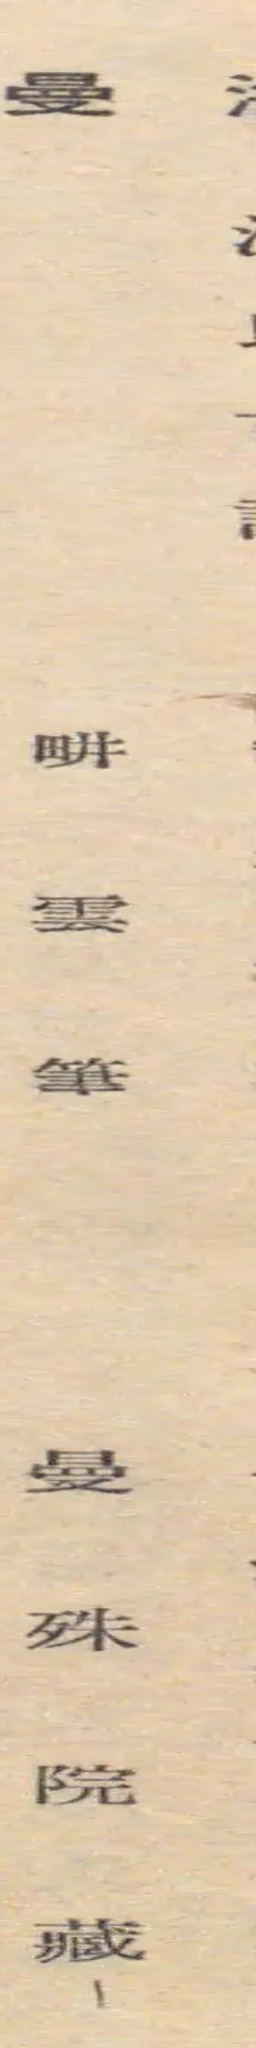曼畊雲筆曼殊院蔵

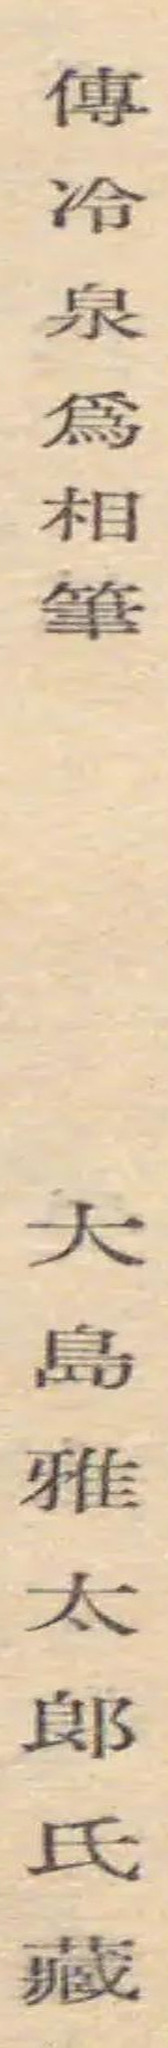冷伝冷泉為相筆大島雅太郎氏蔵
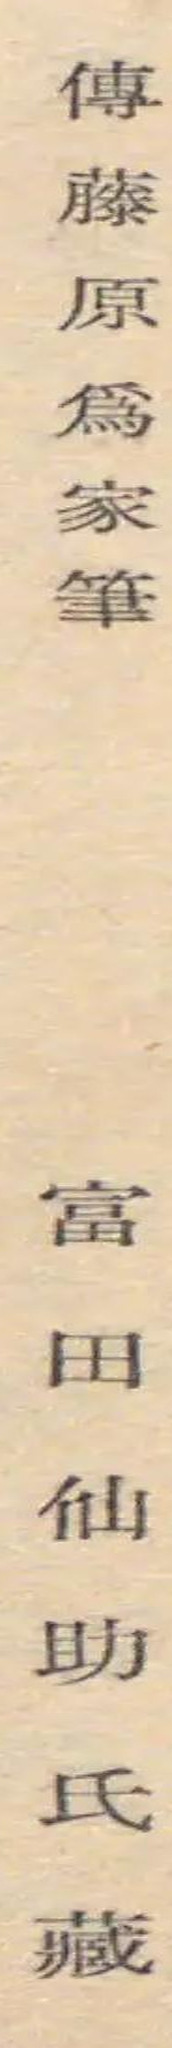富伝藤原為家筆富田仙助氏蔵
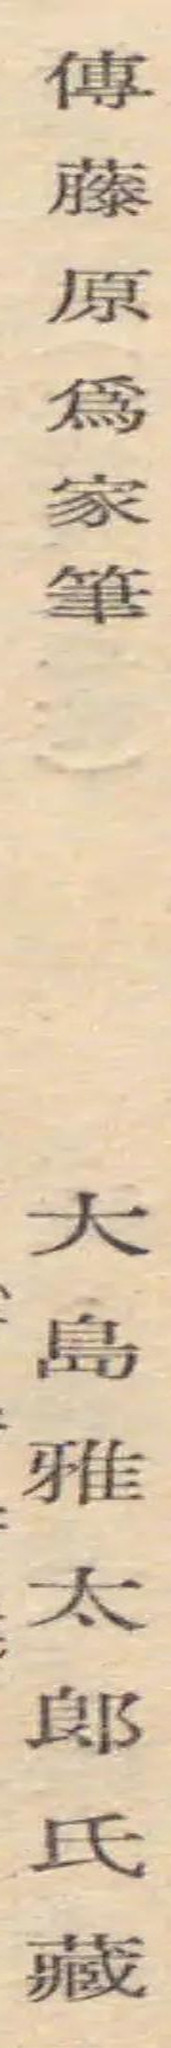青伝藤原為家筆大島雅太郎氏蔵
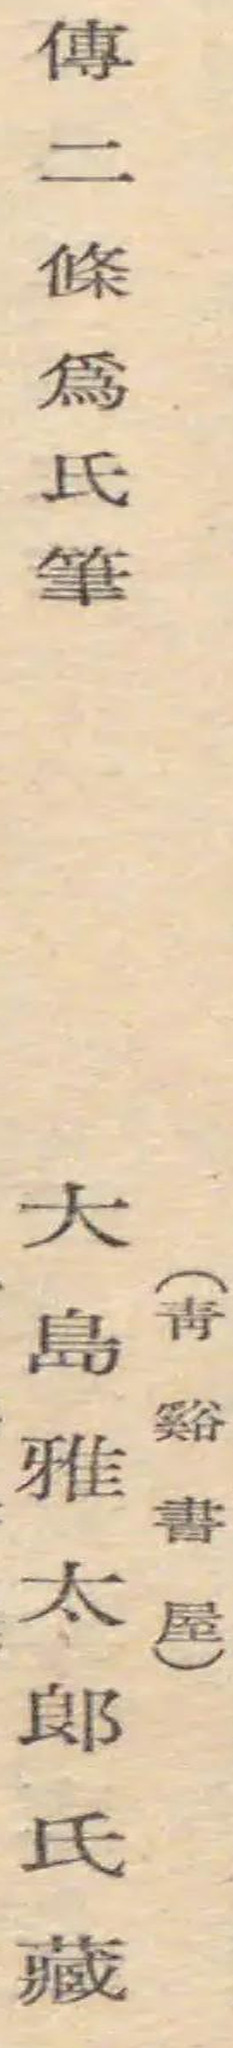谿伝二条為氏筆大島雅太郎氏蔵
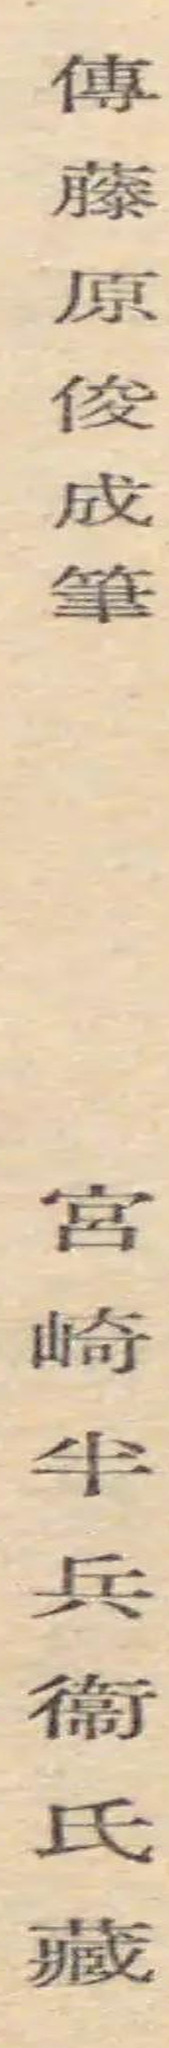俊伝藤原俊成筆宮崎半兵衛氏蔵
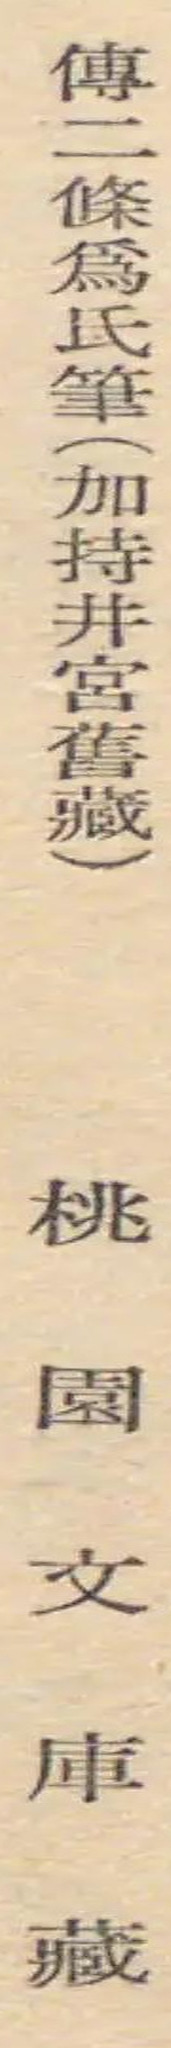加伝二条為氏筆(加持井宮旧蔵)桃園文庫蔵
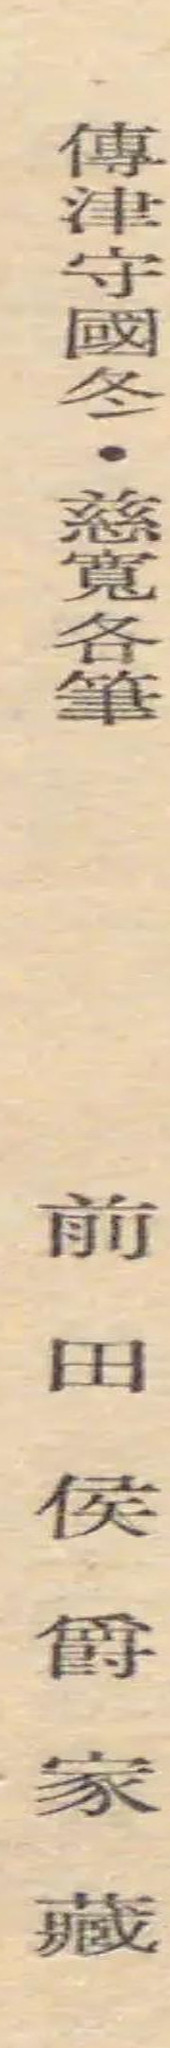前伝津守国冬・慈寛各筆前田侯爵家蔵
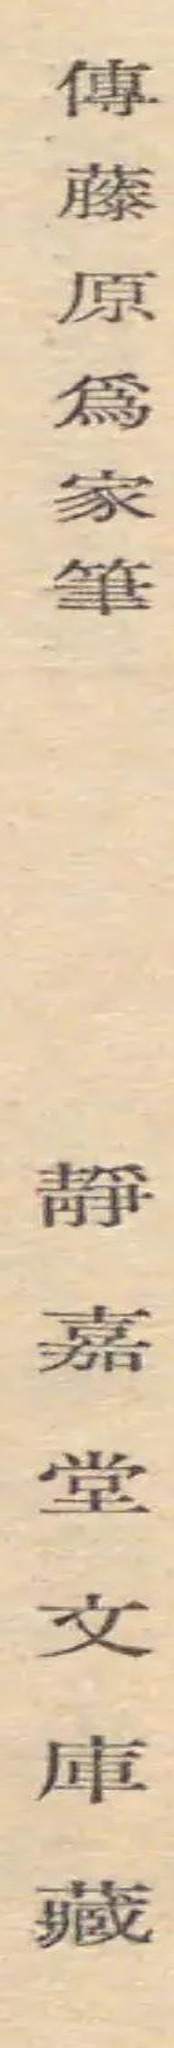静伝藤原為家筆静嘉堂文庫蔵
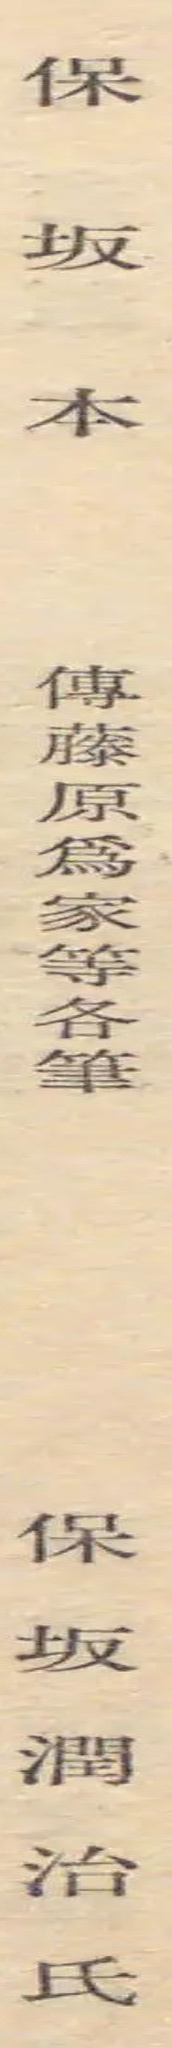保保坂本伝藤原為家等各筆保坂潤治氏蔵
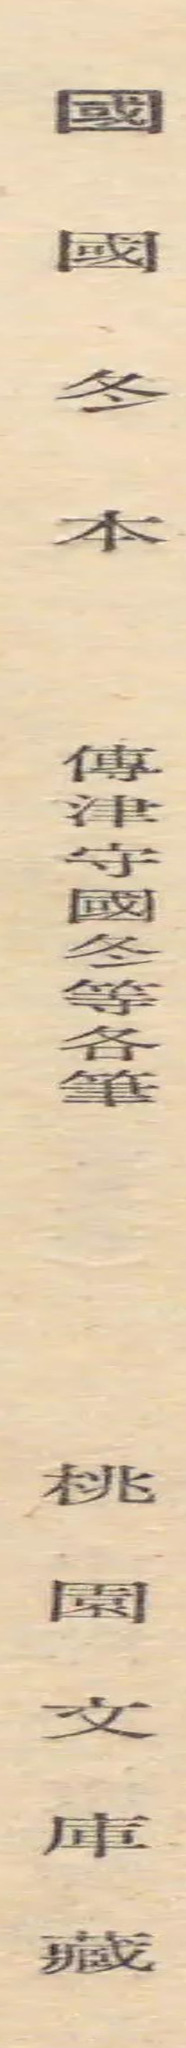国国冬本伝津守国冬等各筆桃園文庫蔵
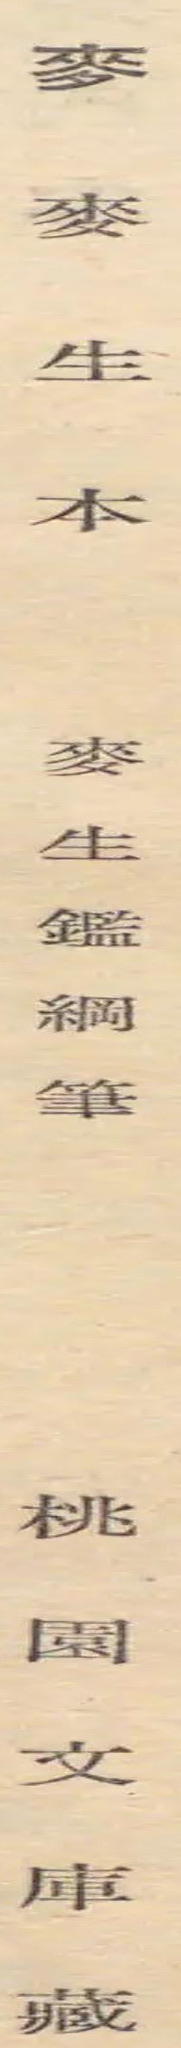麦麦生本麦生鑑綱筆桃園文庫蔵
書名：校異源氏物語.
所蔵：国立国会図書館 National Diet Library, JAPAN
